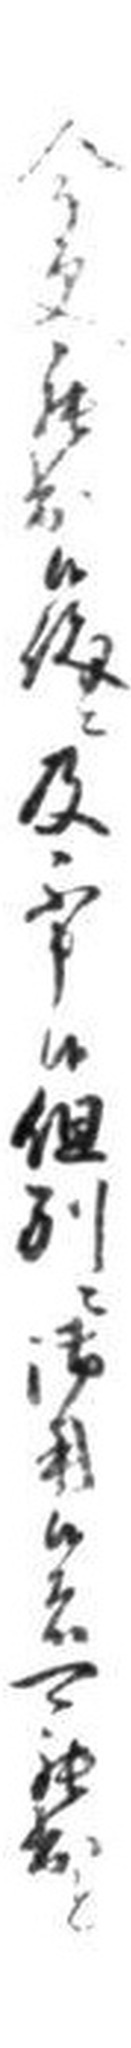今更罷出候儀ニ及不申候但別ニ御用候者可罷出と
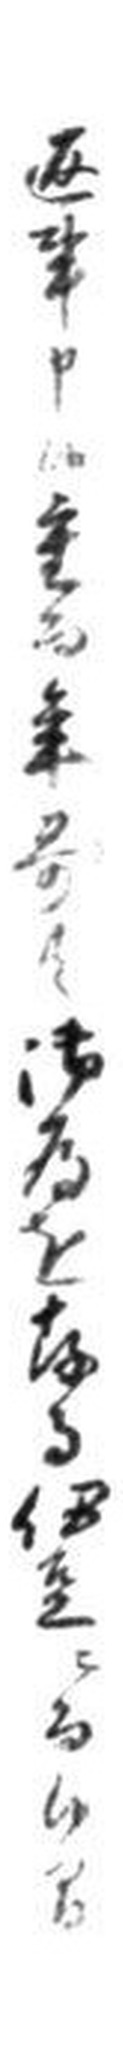返事申候重而年寄共御為を存る伊豆ニ而候間
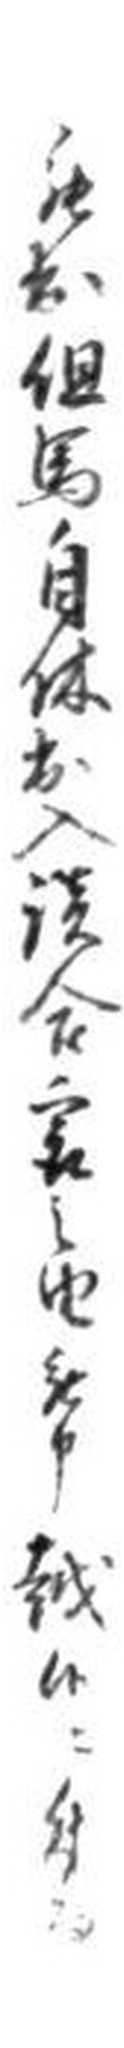罷出但馬自休出入談合最之由被申越候ニ付而
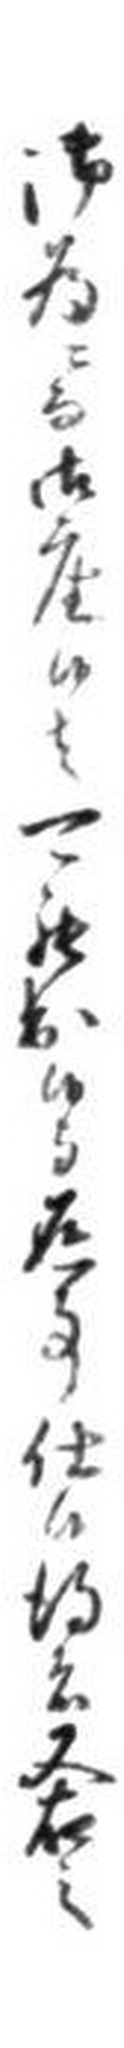御為ニ而御座候者可罷出候与返事仕候得者又右之
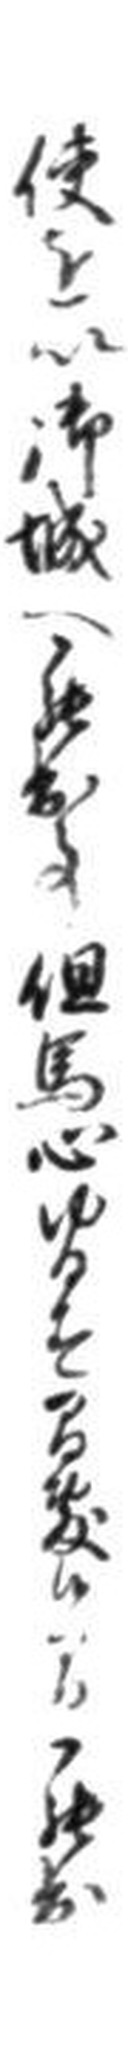使を以御城へ罷出事但馬心ゆるす間敷候間罷出
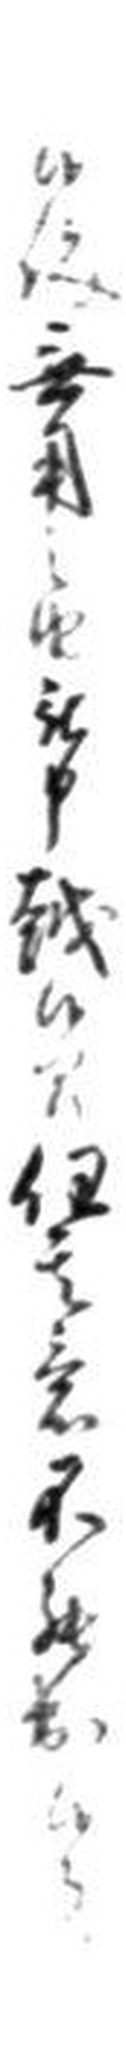候儀無用之由被申越候間任其意不罷出候事
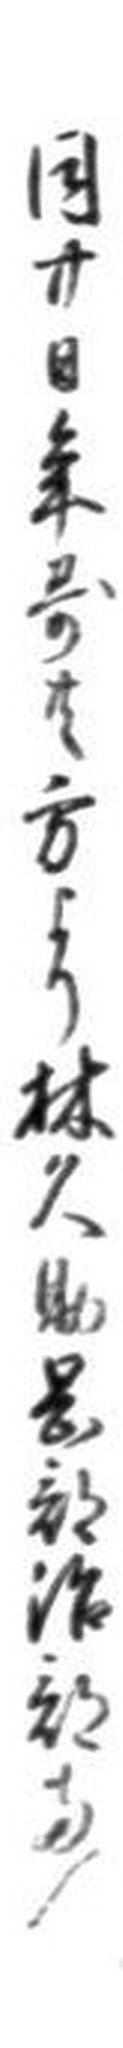同廿日年寄共方より林久助岡部治部両人
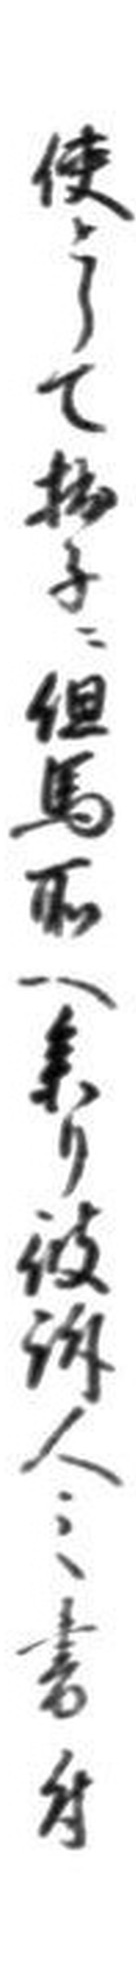使として拙子ニ但馬所へ参り彼訴人之書付
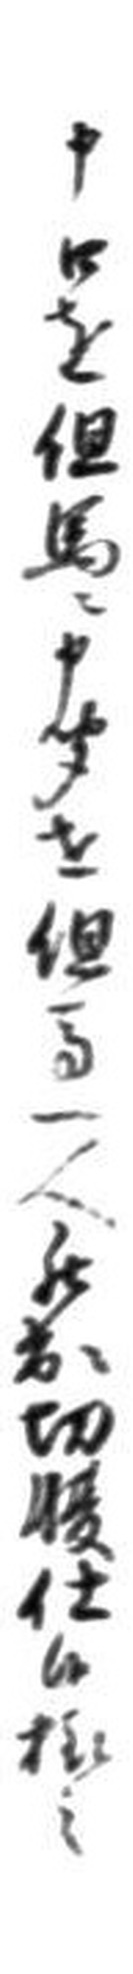申口を但馬ニ申聞せ但馬一人罷出切腹仕候様之
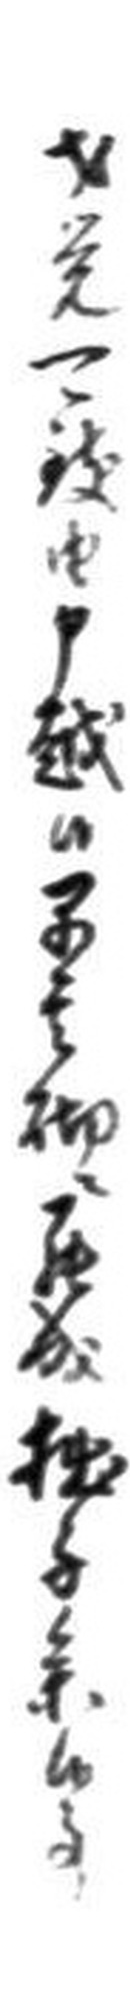才覚可致由申越候早其砌ニ罷成拙子参候事
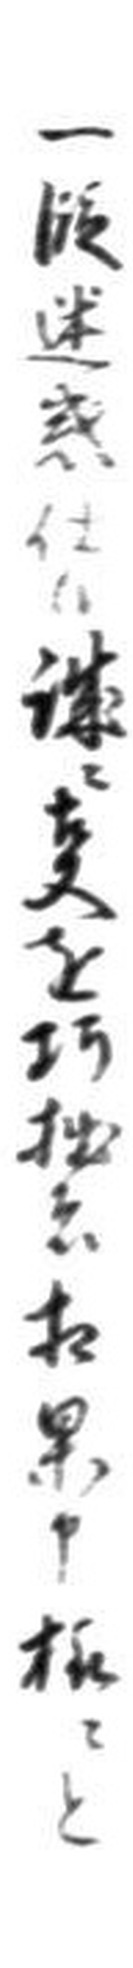一段迷惑仕候誠ニ事を巧拙者相果申様ニと
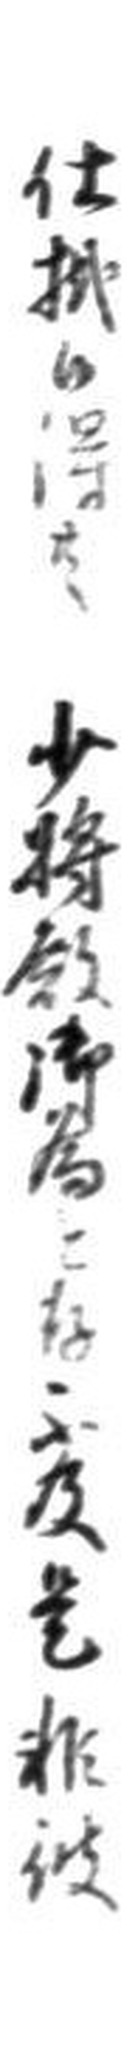仕掛候得共少将殿御為と存不及是非彼
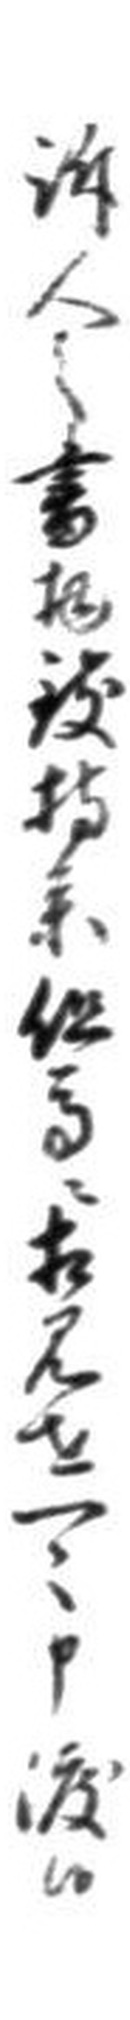訴人之書物致持参但馬ニ相見せ一々申渡候
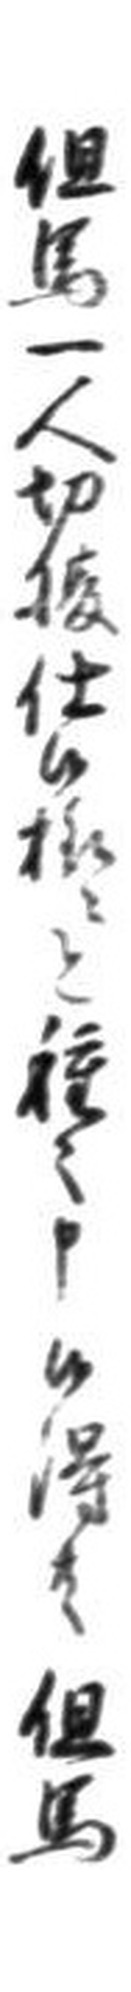但馬一人切腹仕候様ニと種々申候得共但馬
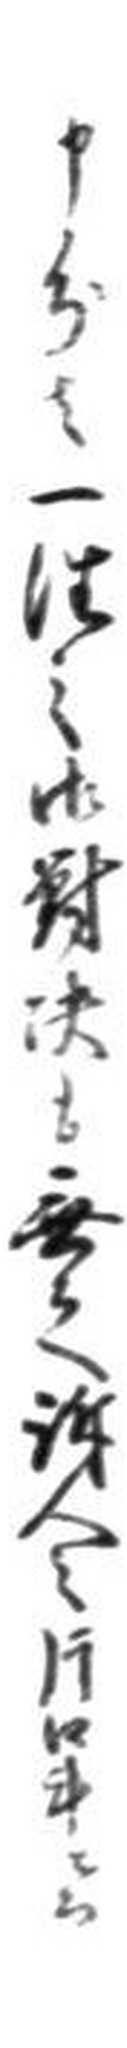申分者一往之御対決も無之訴人之片口斗ニ而
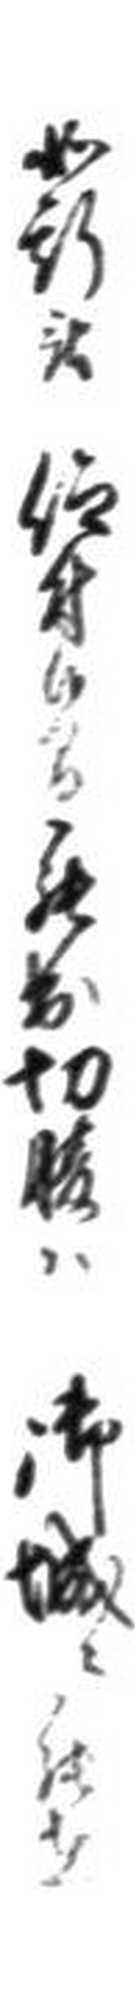如斯被仰付候間罷出切腹ハ御城ニ罷在
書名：家譜 二 忠直公 従文禄四年到慶安四年
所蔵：福井県文書館 Fukui Prefectural Archives
